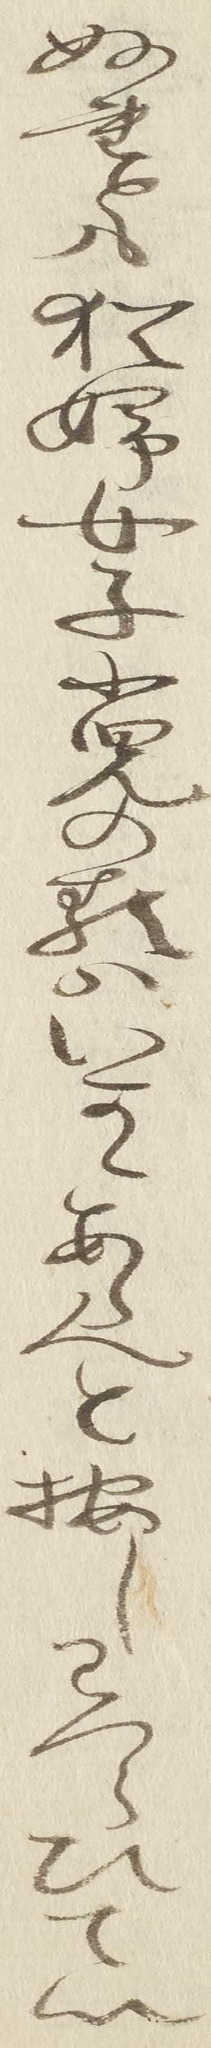ぬれとも猶婦女子小児の類はいかゝあらんと按しわつらひてい
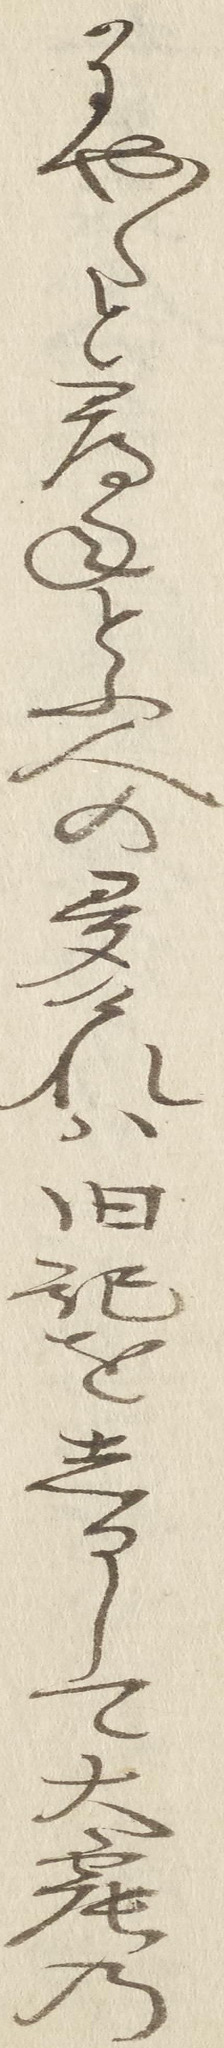かにやと尋ねとふ人の多けれは旧記をしるして大震の
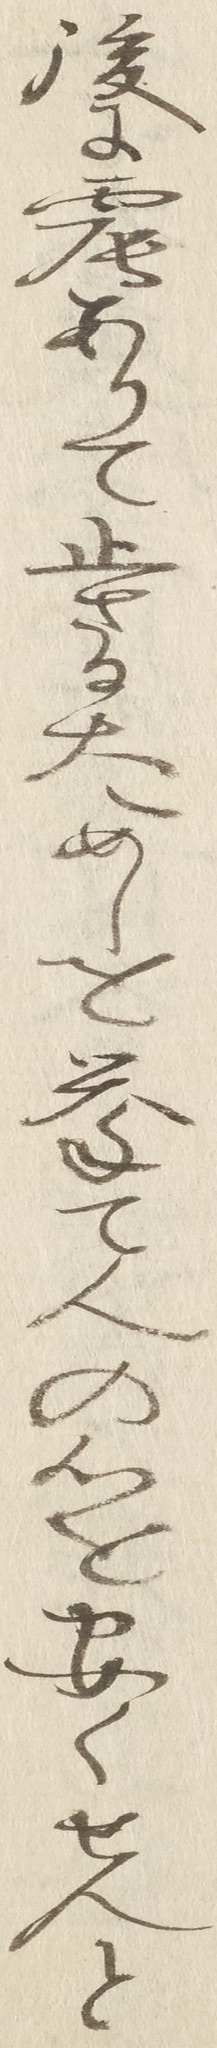後に震ありて止さるためしを挙て人の心を安くせんと
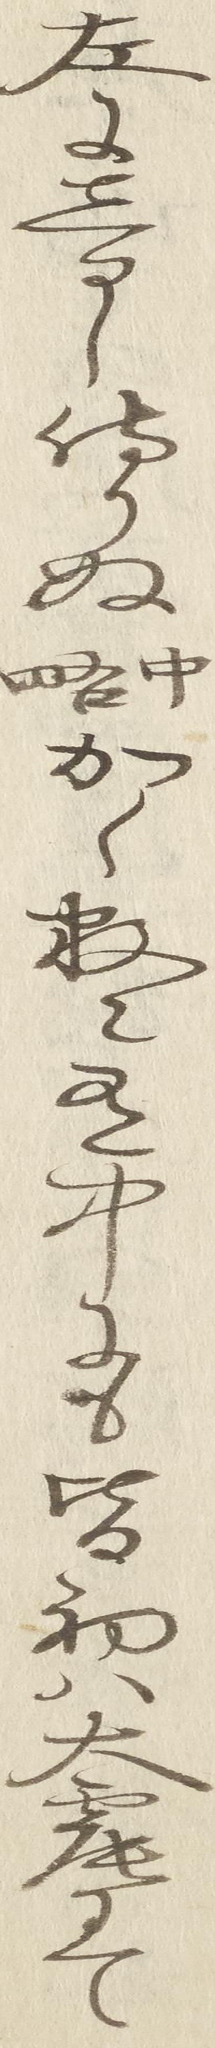左にしるし侍りぬ中略かく数々有中にも皆初は大震にて
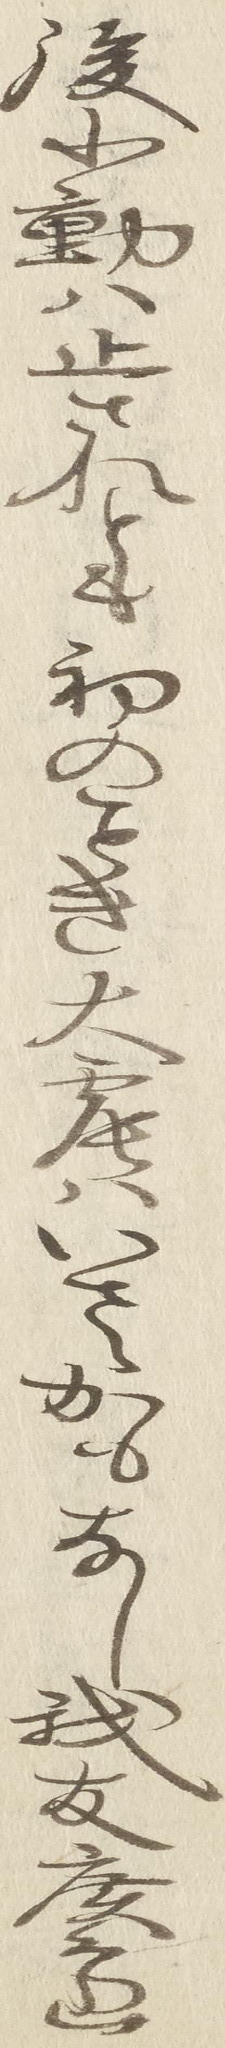後小動は止されとも初のことき大震はいさゝかもなし我友広島
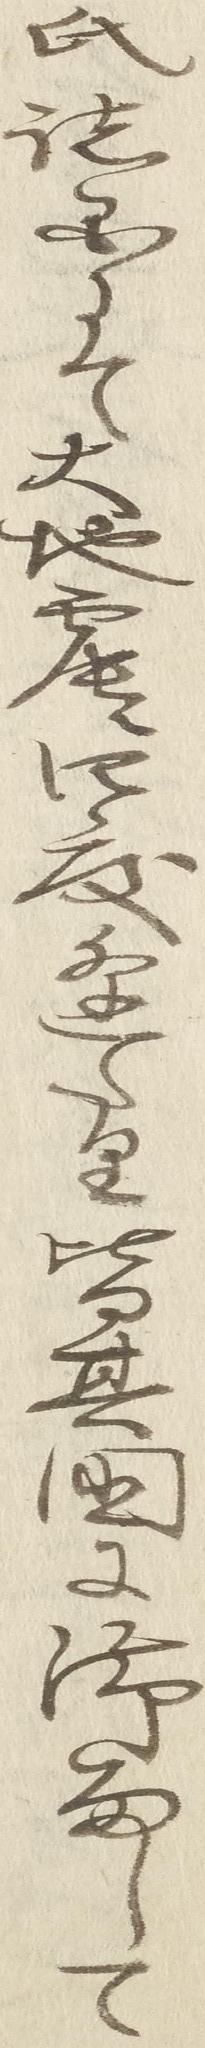氏諸国にて大地震に四度逢たり皆其国に滞留して
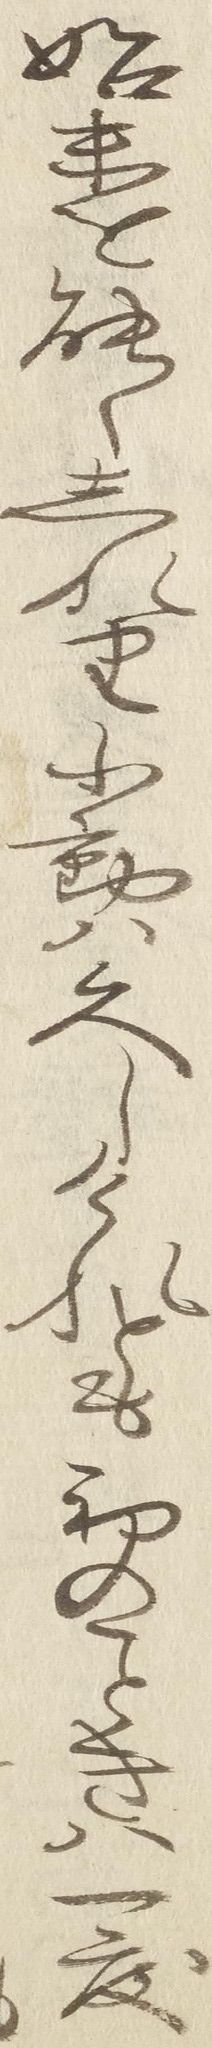始末を能くしれり小動は久しけれとも初のこときは一度も

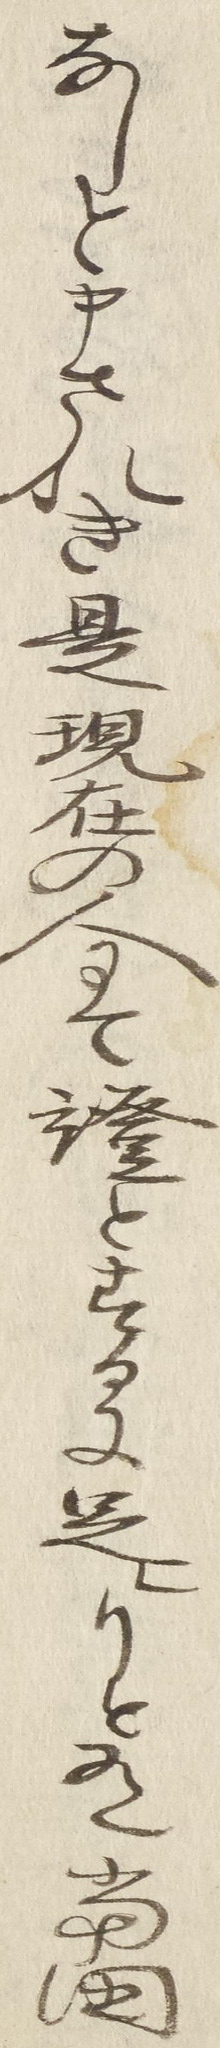なしと申されき是現在の人にて證とするに足れりと有当国
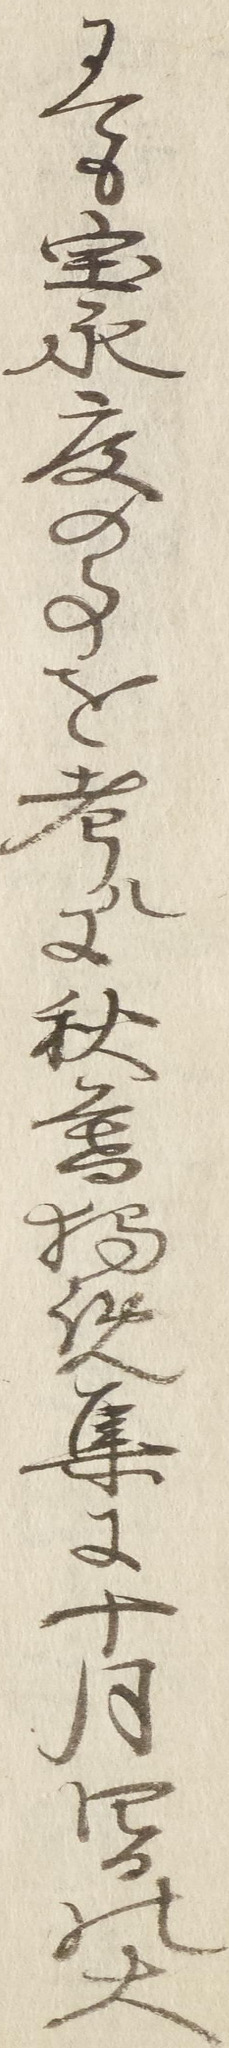にても宝永度の事を考るに秋暮掲覧集に十月四日の大
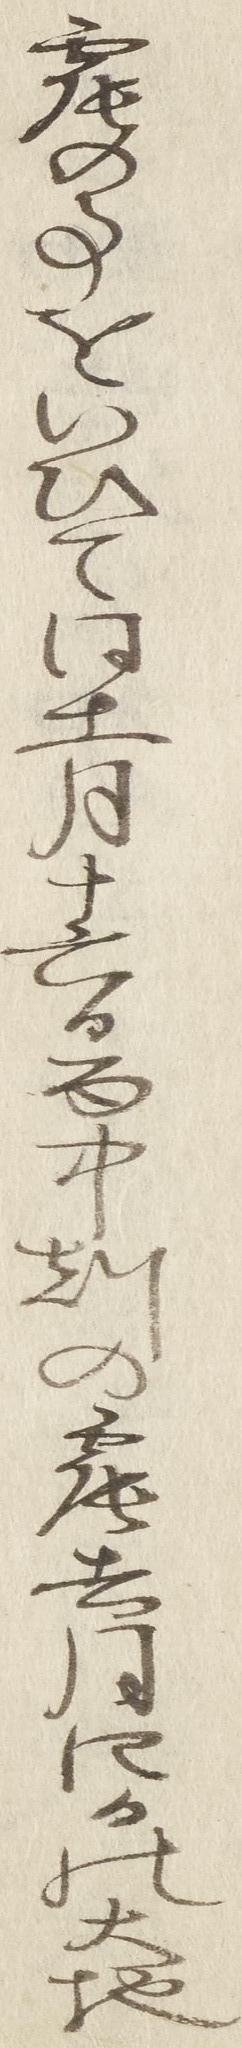震の事をいひて同十一月十六日酉中刻の震去月四日の大地
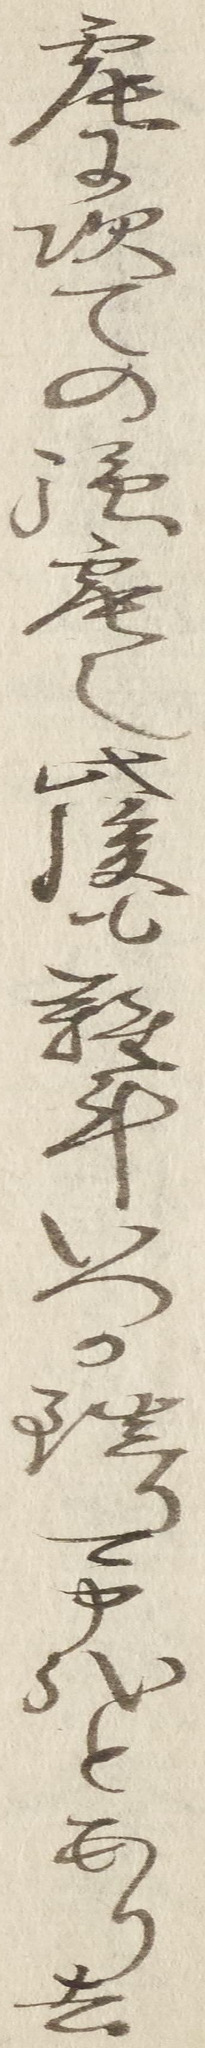震に次ての強震也此後も難計いつか鎮り可申哉とあり去
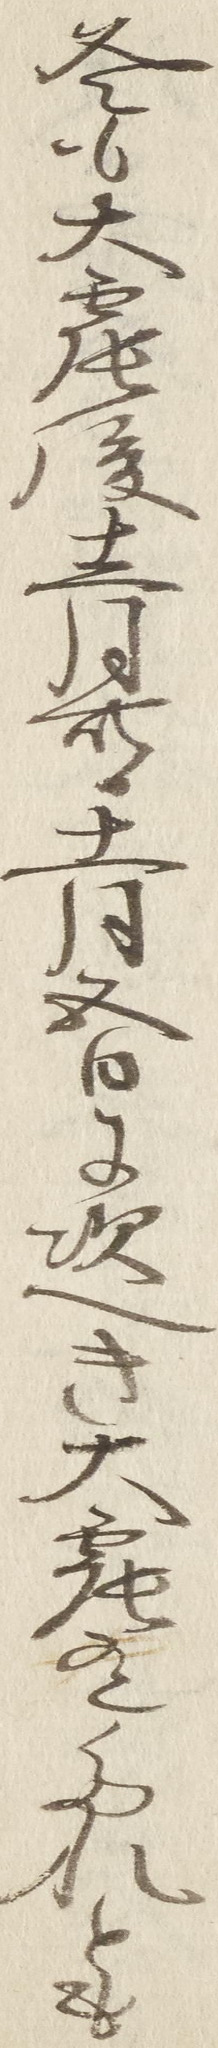冬も大震後十二月卅日十一月五日に次へき大震有たれとも
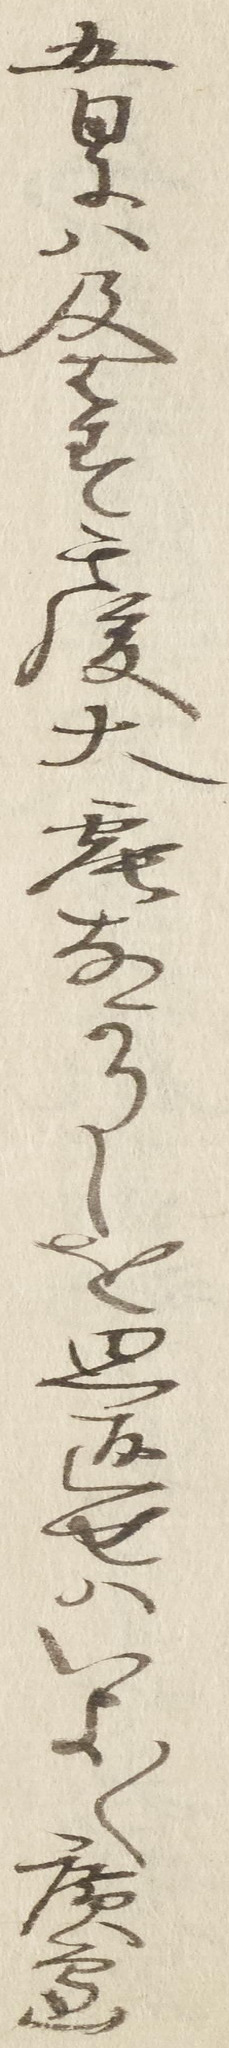五日には及はす其後大震なかりしを思返せはいよ〳〵広島
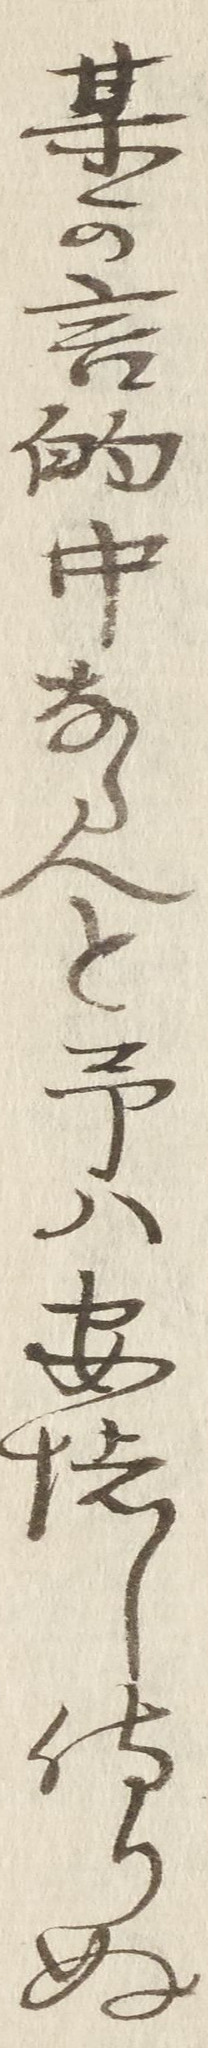某か言的中ならんと予は安堵し侍りぬ
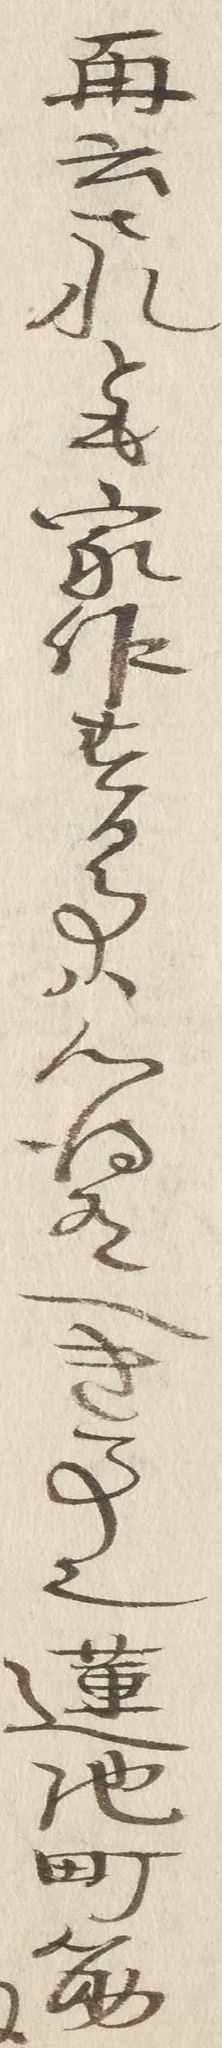再云されとも家作する事は心得有へき事也蓮池町筋に
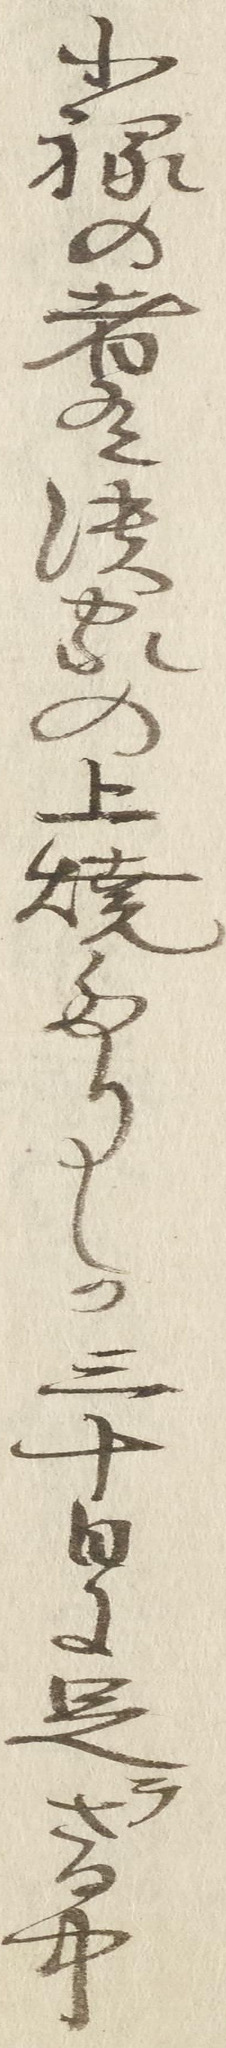小禄の者有潰家の上焼たりしか三十日に足らさる中
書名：地震記　上
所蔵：東京大学地震研究所図書室 Earthquake Research Institute Library, The University of Tokyo, JAPAN
